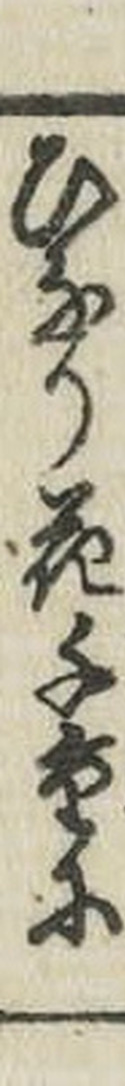ひなり花千重に
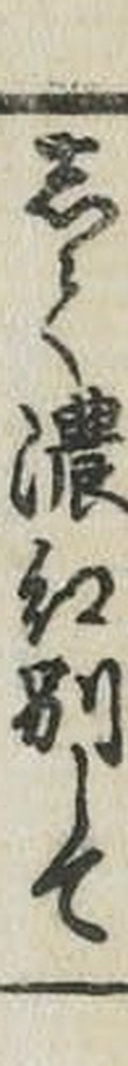して濃紅別して
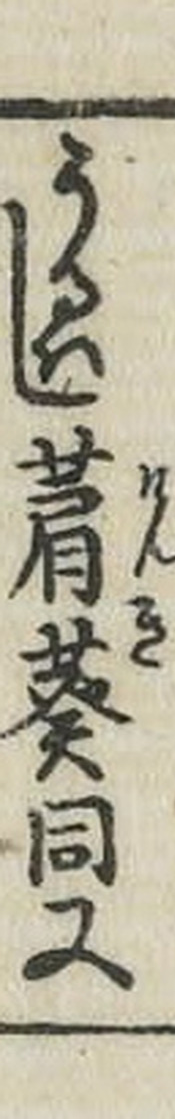うるはし菺葵同又
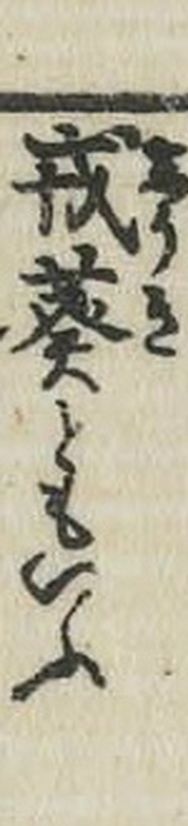戎葵ともいふ
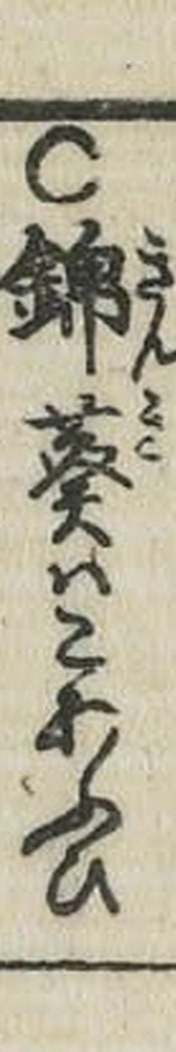○錦葵はこあふひ
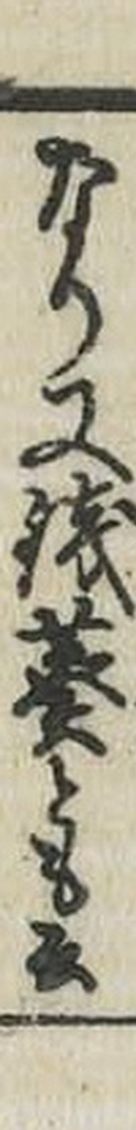なり又銭葵とも云

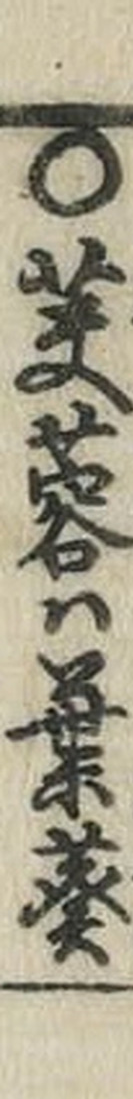○芙蓉は葉葵
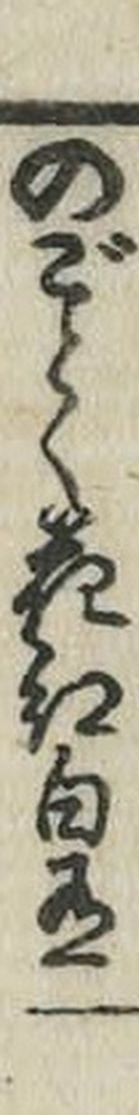のごとく花紅白有
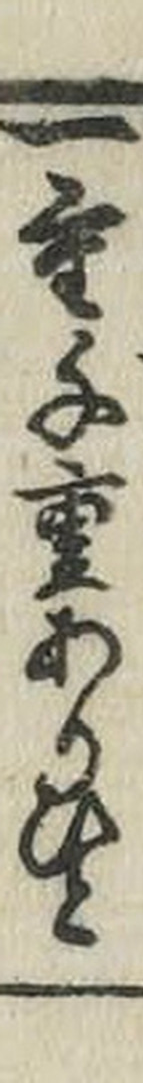一重千重ありひと
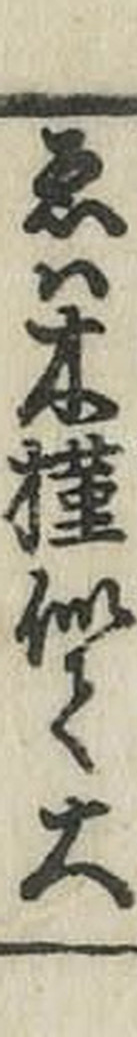ゑは木槿似て大
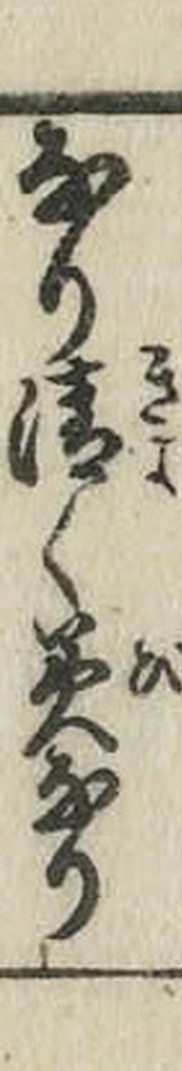なり清く美なり
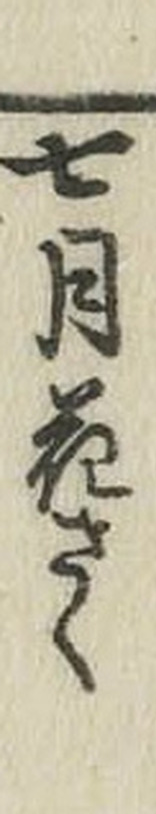七月花さく
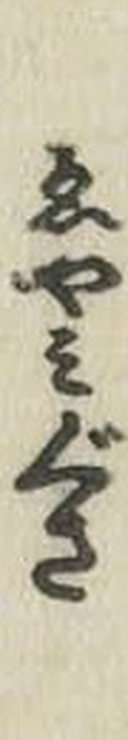ゑやみぐさ
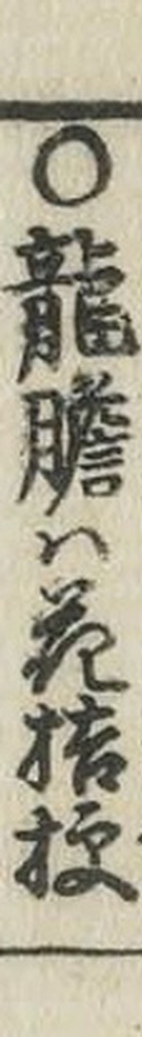○龍肝は花桔梗
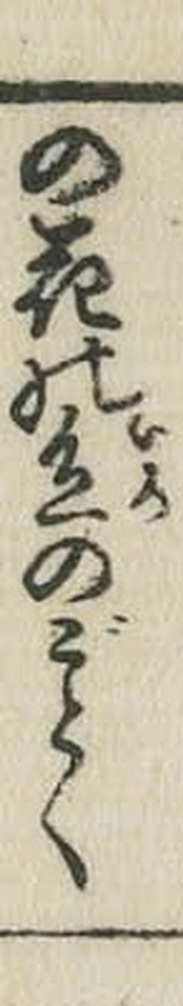の花の色のごとく
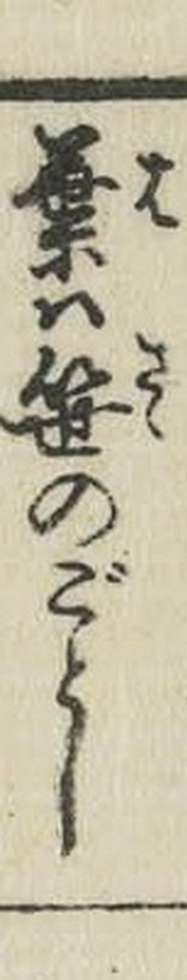葉は笹のごとし
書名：増補頭書訓蒙図彙大成 10巻 9:巻之20
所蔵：東京学芸大学教育コンテンツアーカイブ
